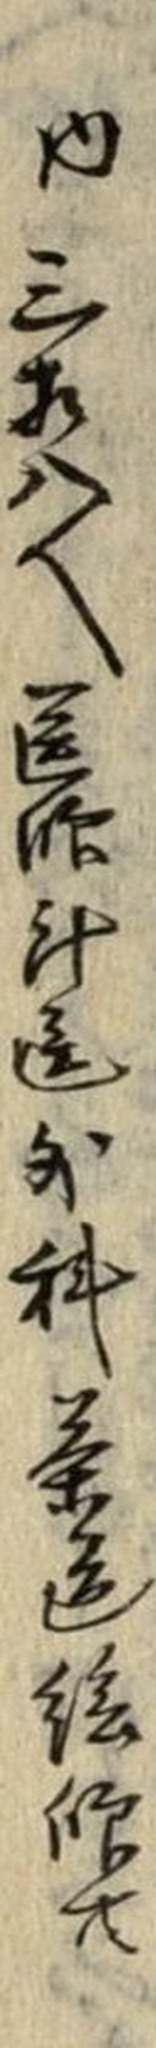内三十八人医師針医外科茶道絵師共
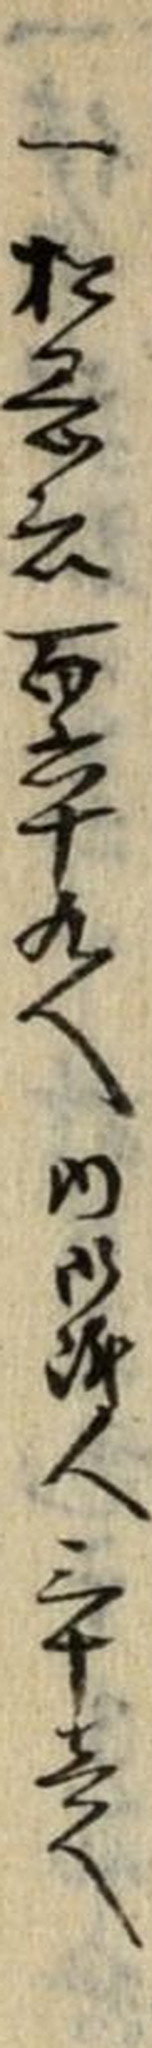一松岡衆百六十九人内御附人三十壱人
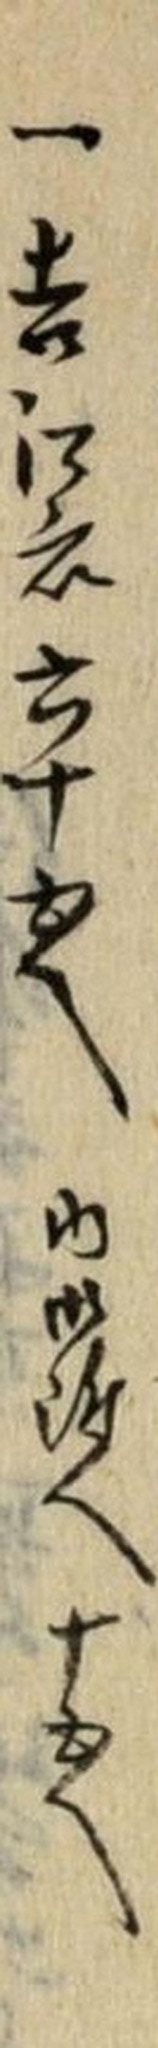一吉江衆六十五人内御附人十五人
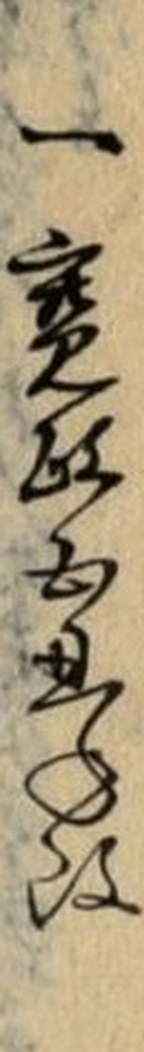一寛政五丑年改
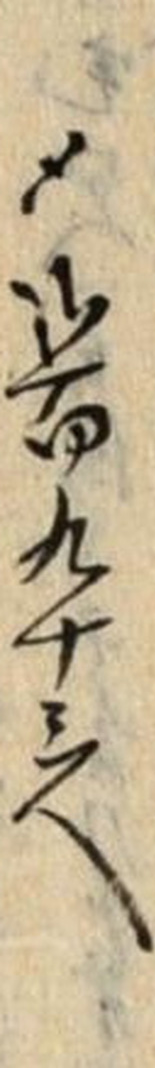〆弐百九十三人
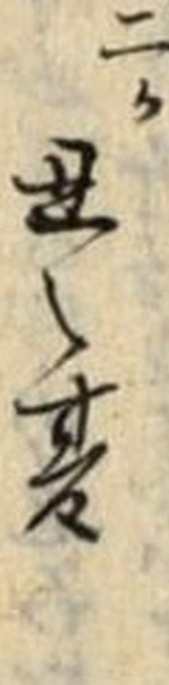丑之夏
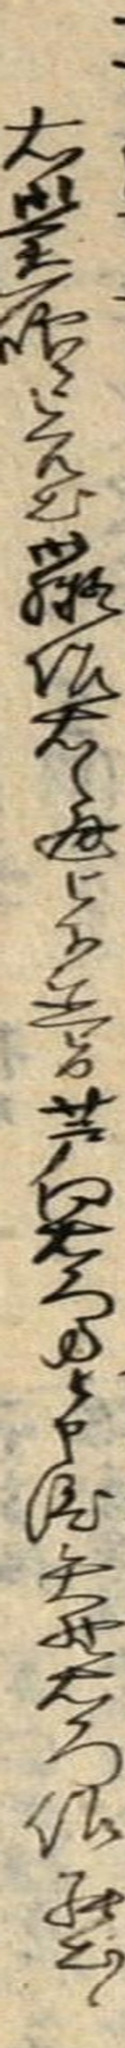右御医師被召出御擬作右之通被下置旨芦田右衛門方被申渡矢野右衛門作罷出候
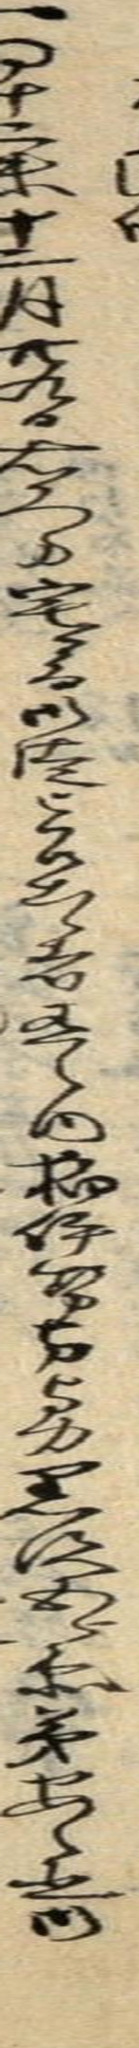一同十二未十二月廿九日右衛門方宅に而御徒被召出候者有之内狛伊勢方与力黒沢五郎兵衛弟安之丞御
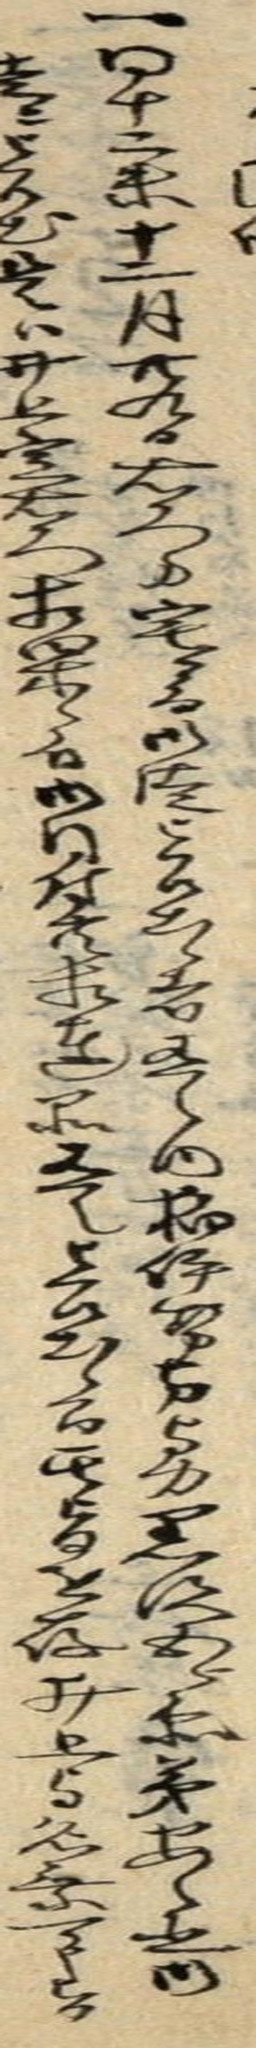徒に被召出是は井上定右衛門相果候に付御目付共相達品有之被召出候間其旨を存井上と名乗可申旨
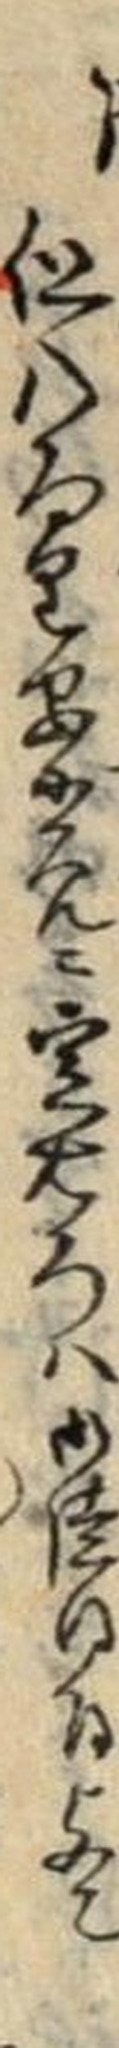但八百里案するに定右衛門は御徒目付歟
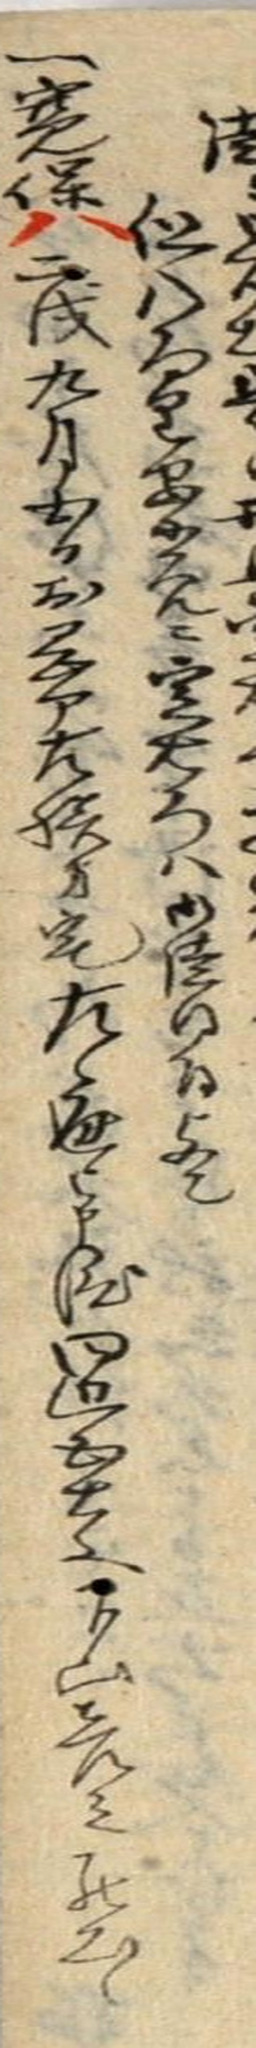一寛保二戌九月五日於岡部左膳方宅左之通被申渡田辺五太夫下山彦三罷出候

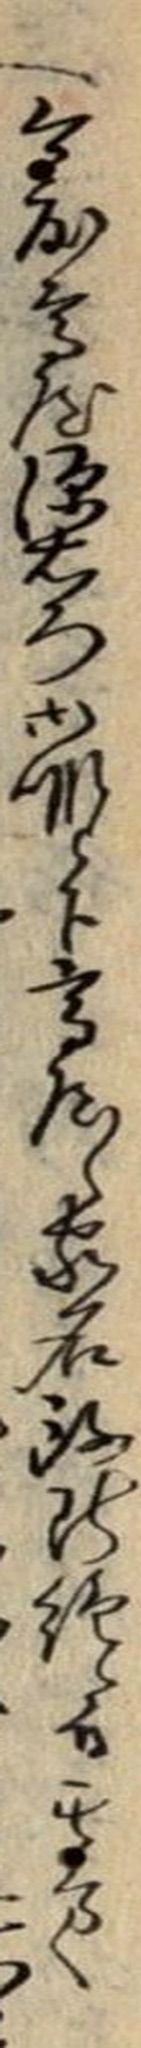今度高屋源右衛門御暇被下高屋之家名致断絶候に付其方へ
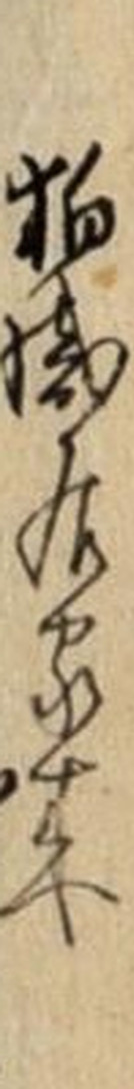狛織居家来
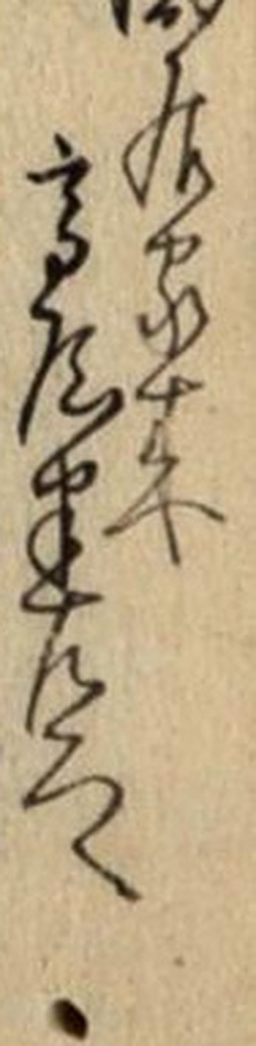高屋半左衛門へ
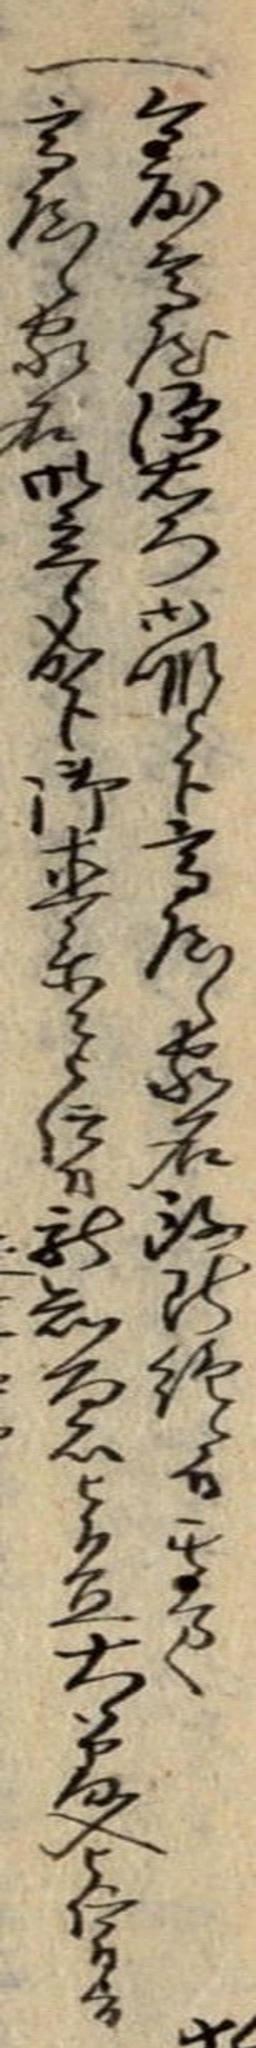高屋之家名御立被成下御直参に被仰付新知百石被下置大御番入被仰付候旨
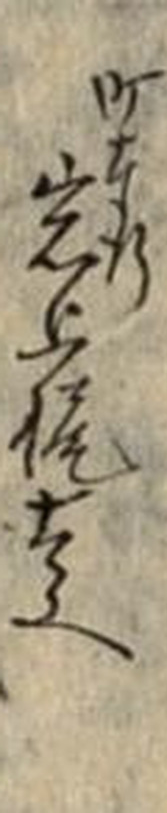岩上梶太夫
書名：御用并被仰出之部
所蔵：福井県文書館 Fukui Prefectural Archives
